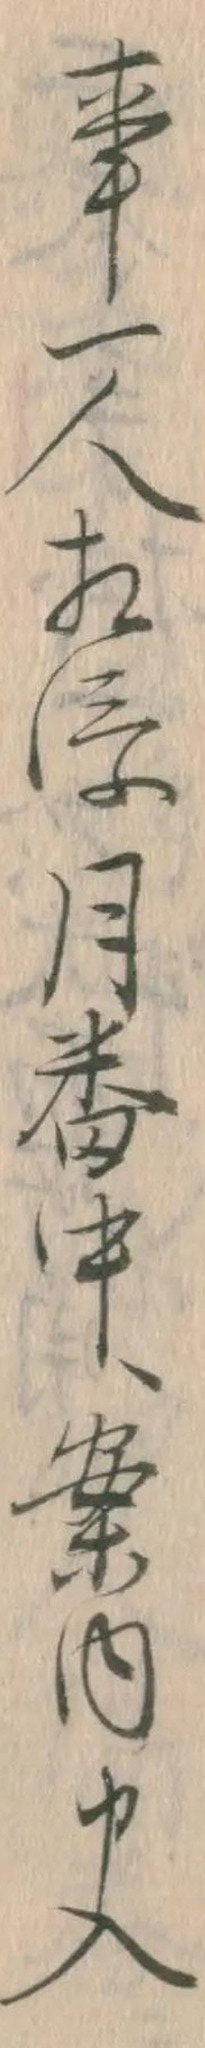事一人相添月番中へ案内申入
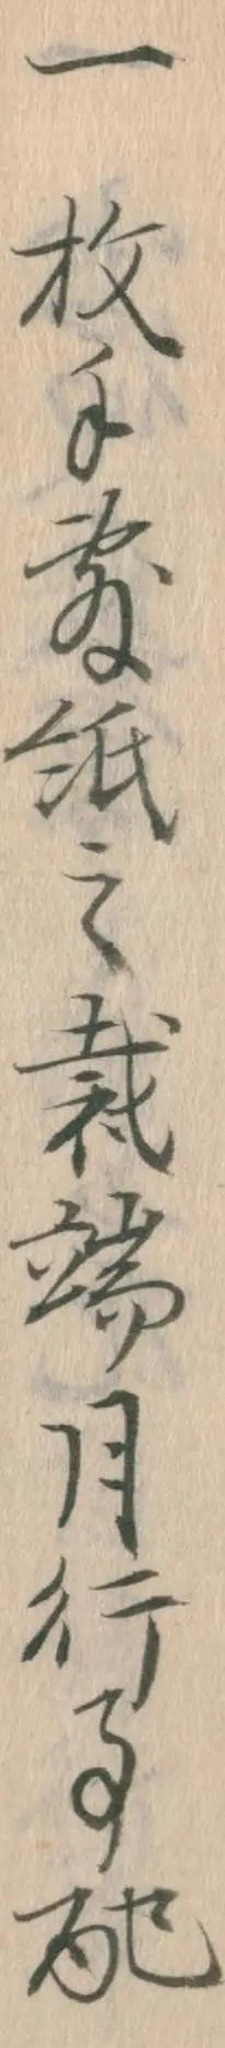一枚手敷紙之裁端月行事配
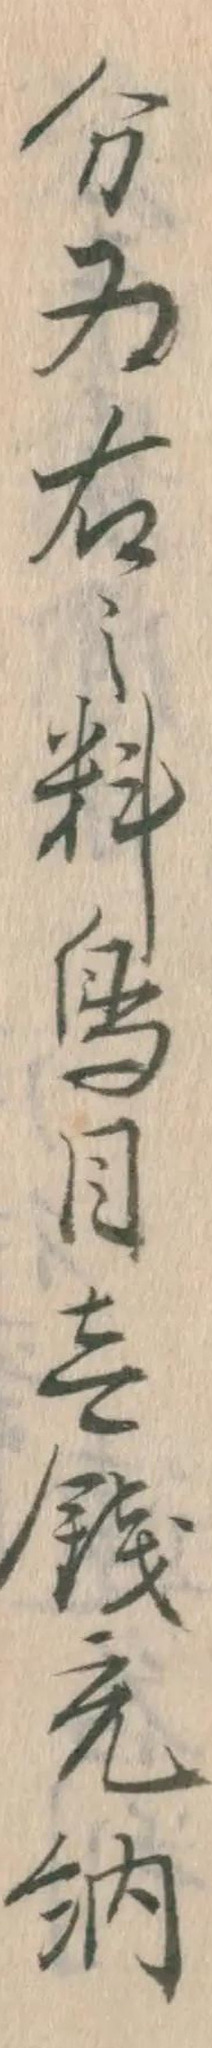分為右之料鳥目壱銭充納
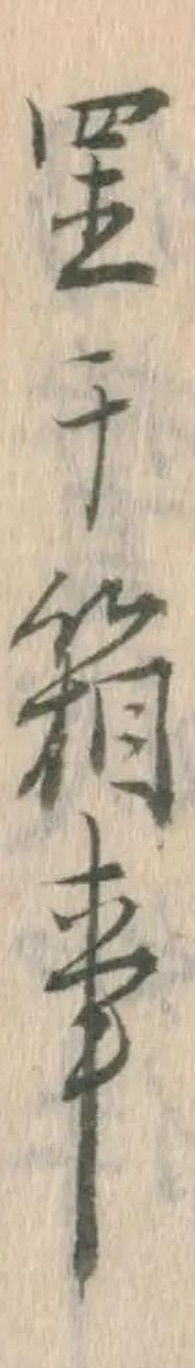置于箱事
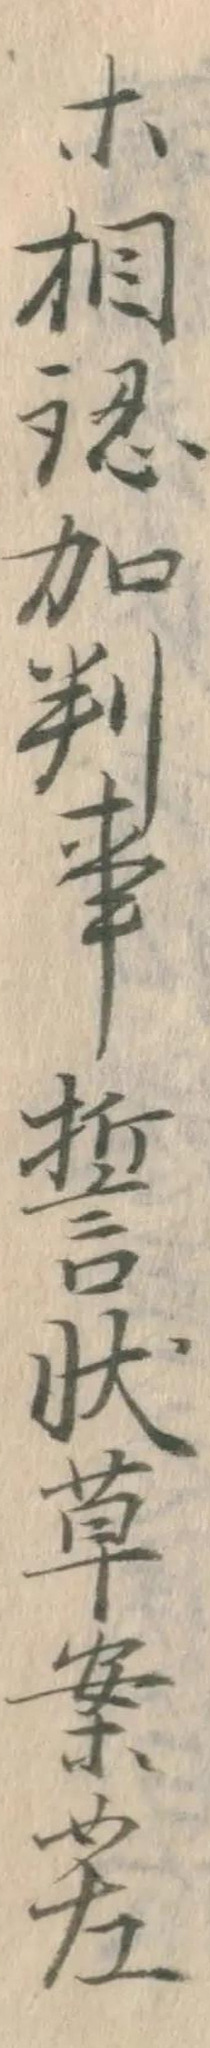等相認加判事誓状草案如左
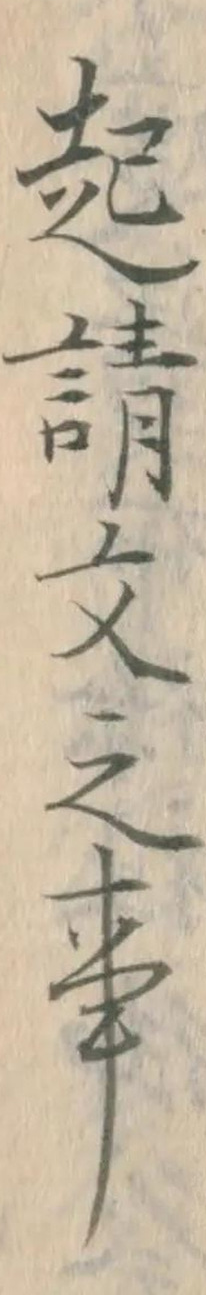起請文之事

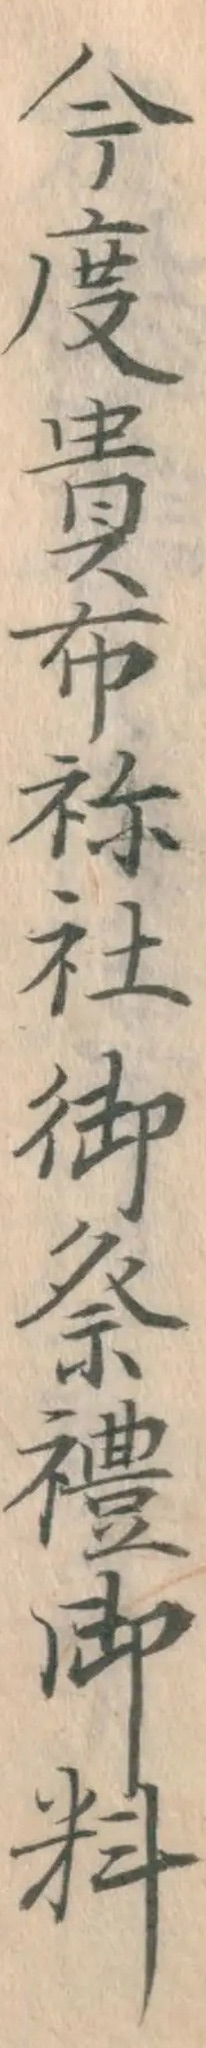今度貴布祢社御祭礼御料
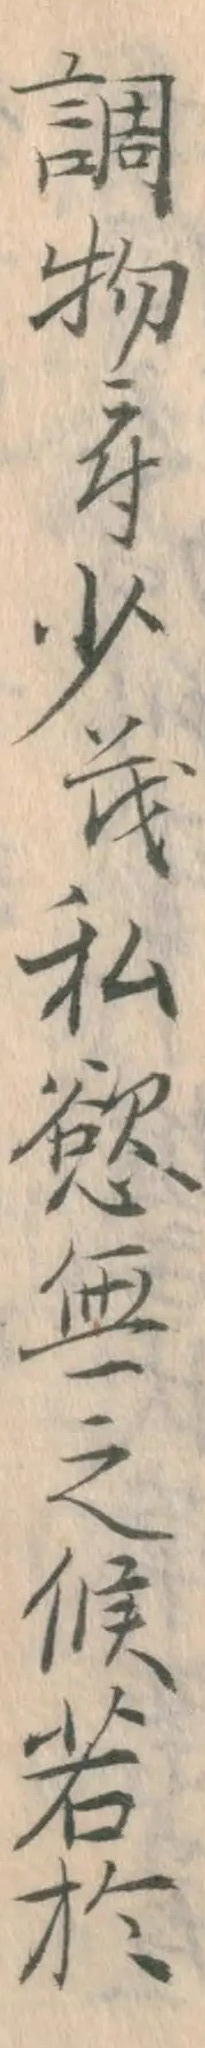調物に付少茂私欲無之候若於
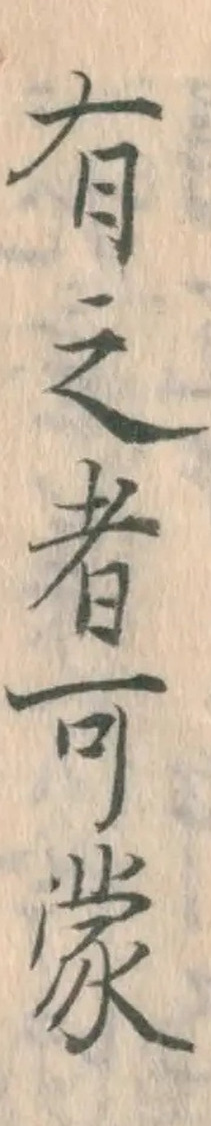有之者可蒙
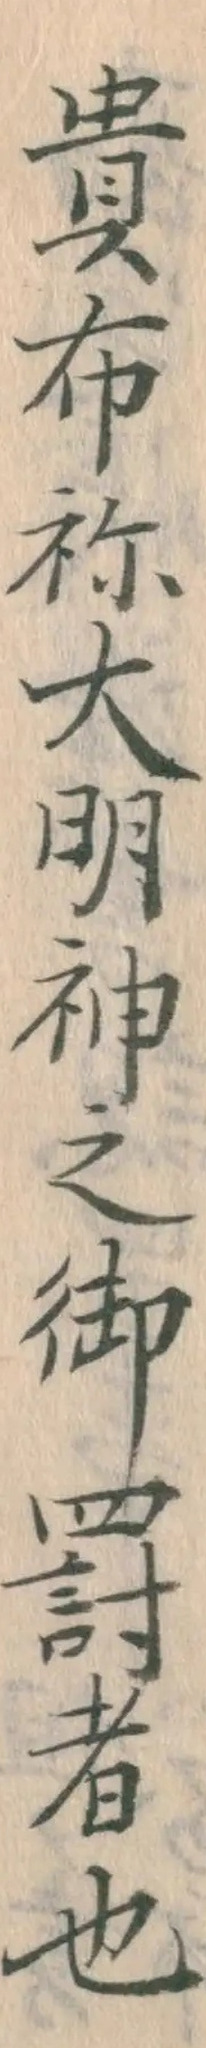貴布祢大明神之御罰者也
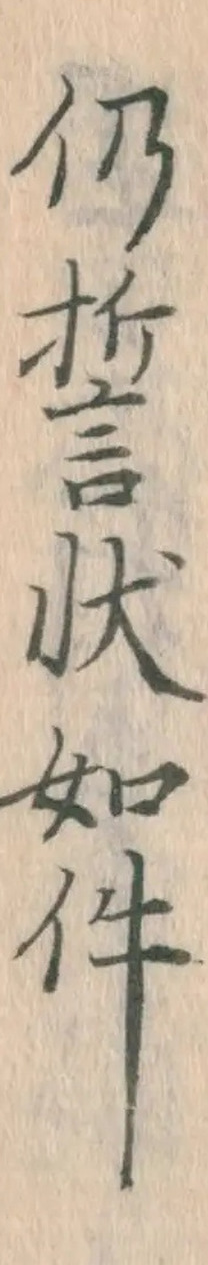仍誓状如件
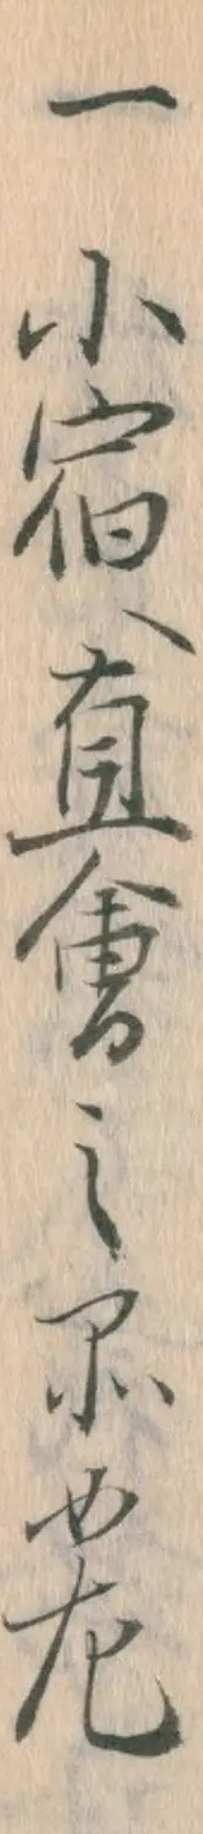一小宿へ直会之品如左
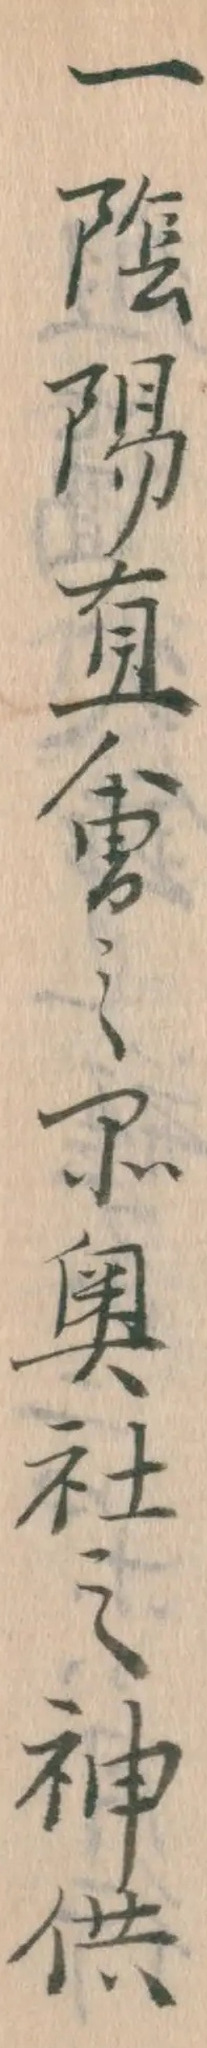一陰陽直会之品奥社之神供
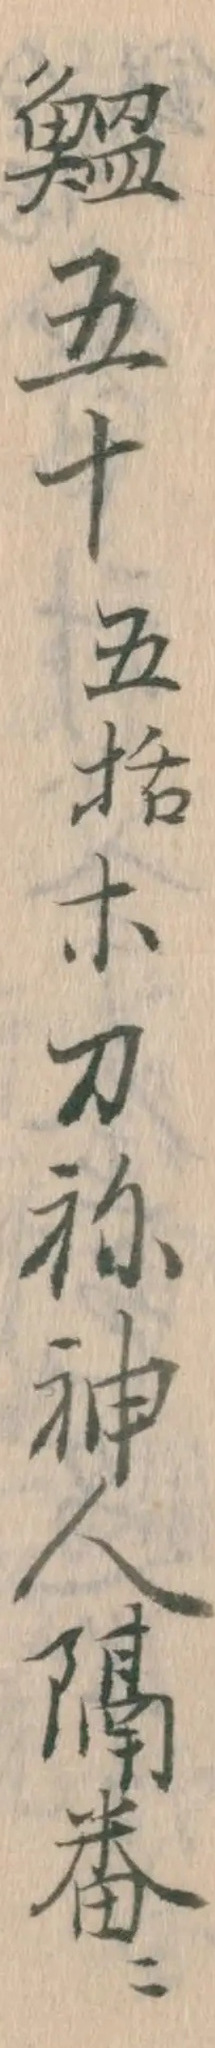鰮五十五括等刀祢神人隔番に
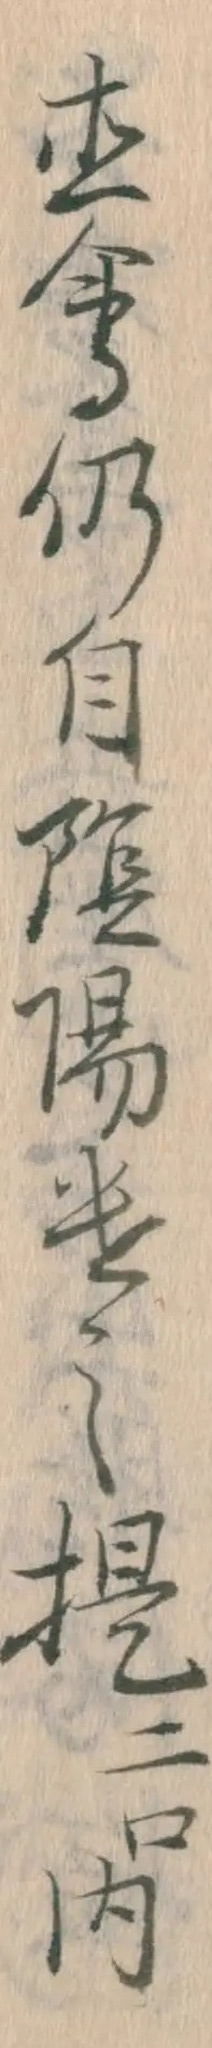直会仍自陰陽遣之堤二口内
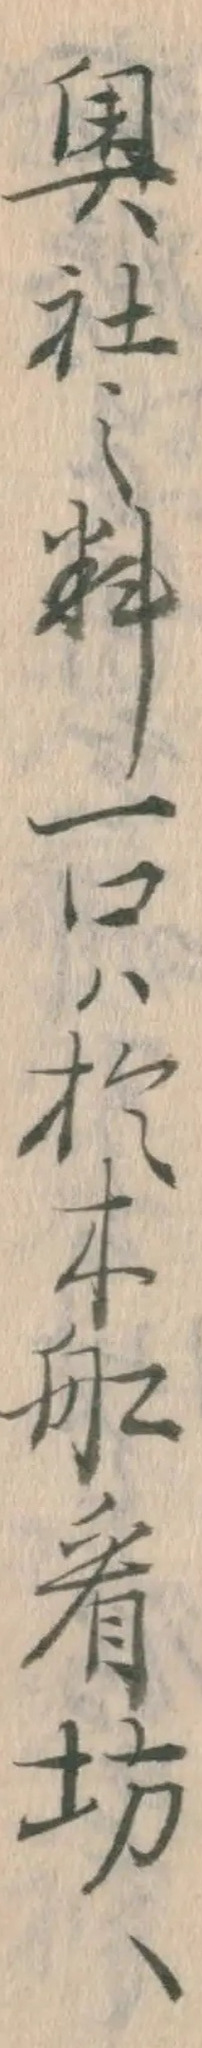奥社之料一口は於木船看坊へ
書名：賀茂社記録. 第81冊
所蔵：国立国会図書館 National Diet Library, JAPAN
